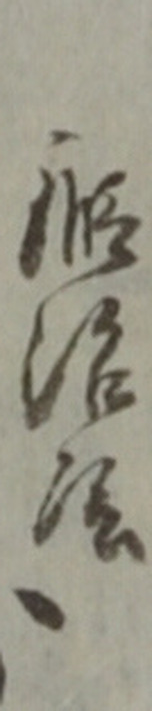鍛冶屋
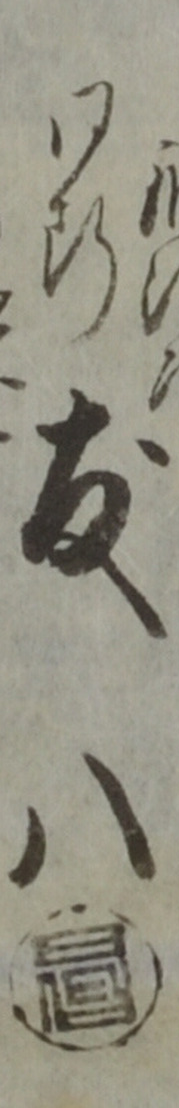同断友八㊞
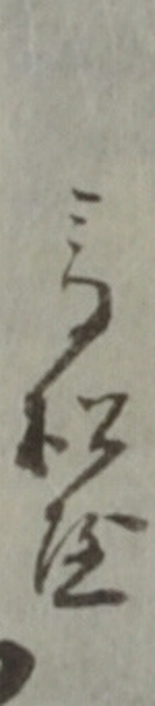高松屋
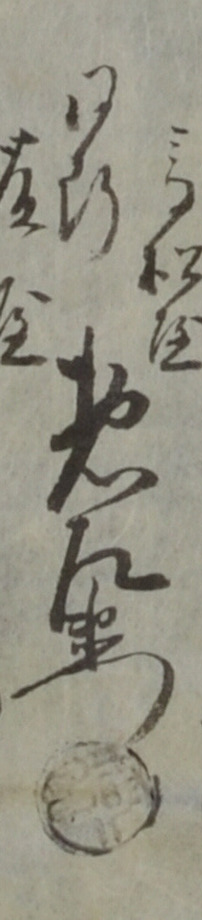同断惣左衛門㊞
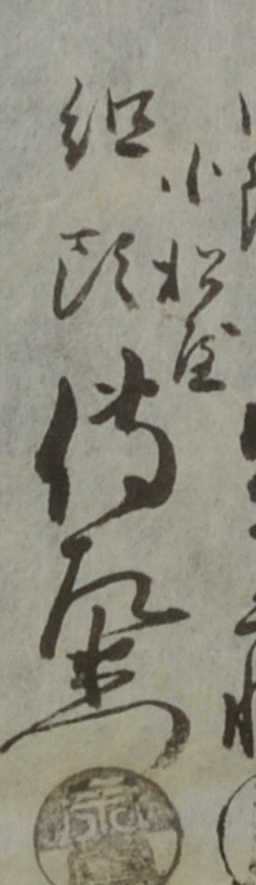組頭伝左衛門㊞
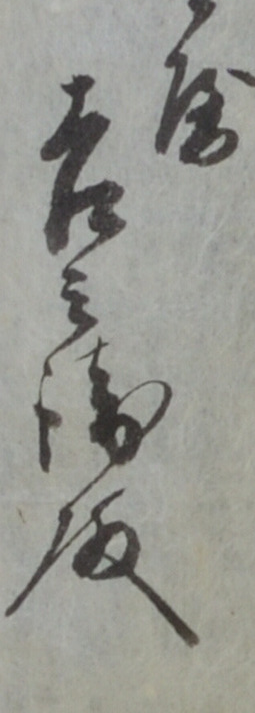吉兵衛殿
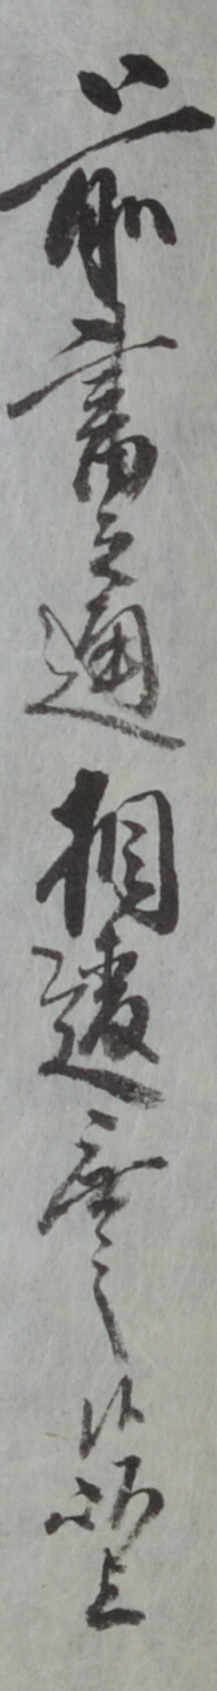前書之通相違無之候以上
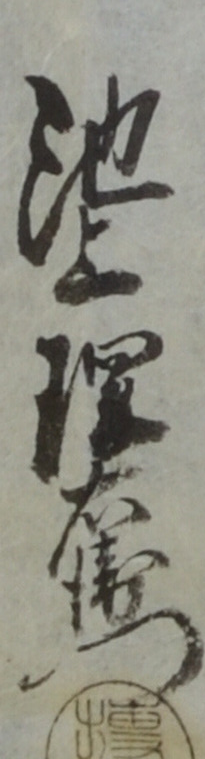池上理右衛門㊞
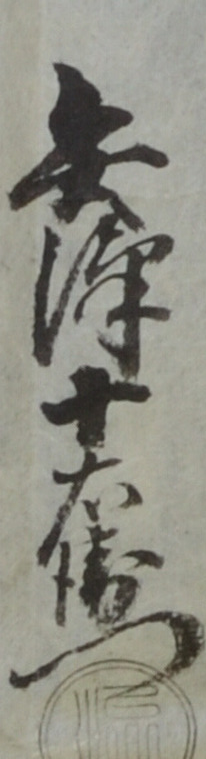矢澤十右衛門㊞
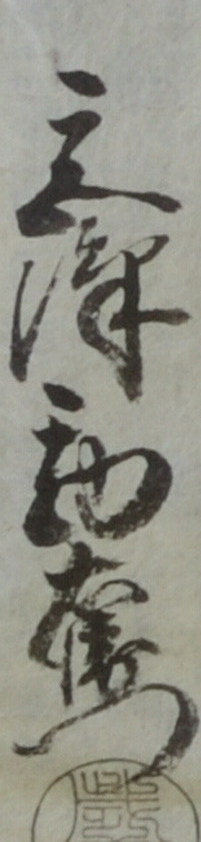宮澤勘右衛門㊞
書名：永譲渡申家屋敷之事
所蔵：伊那市立高遠町図書館・合同会社AMANE
